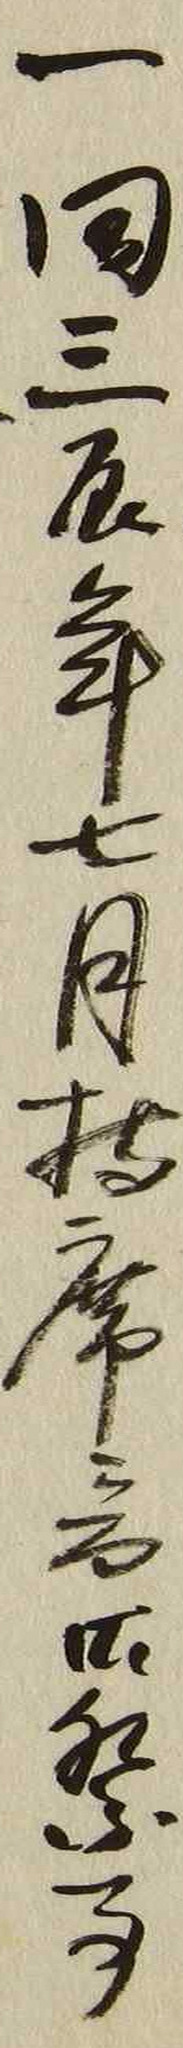一同三辰年七月持席ニ而御祭事
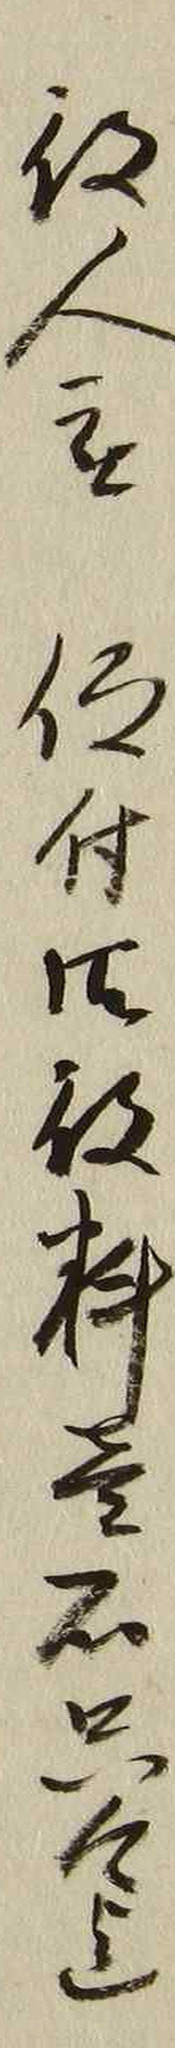役人被仰付御役料壱石只今迄
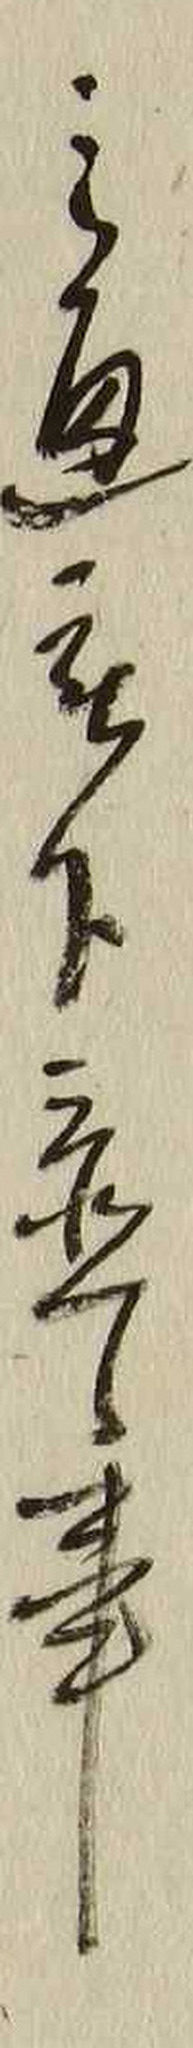之通被下置候事
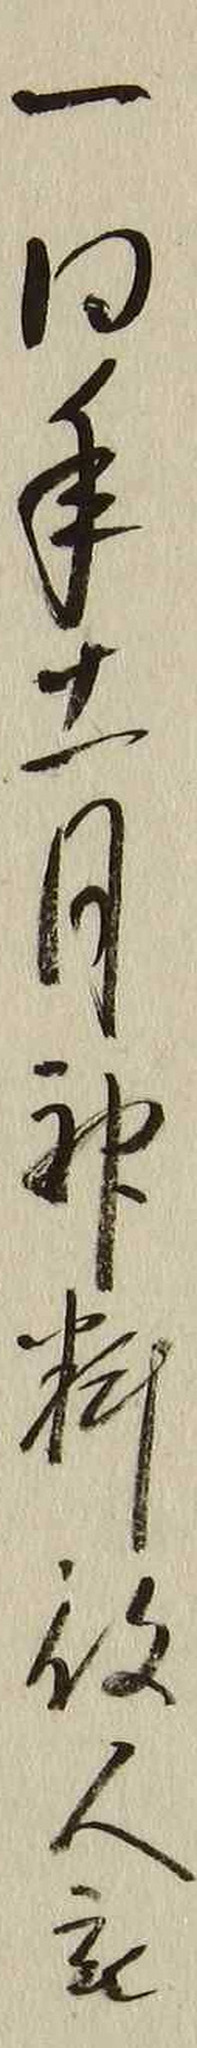一同年十一月神料役人被
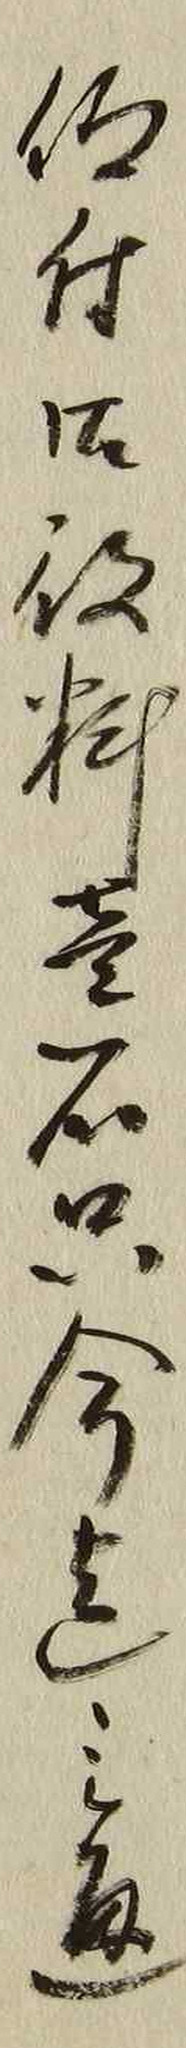仰付御役料壱石只今迄之通
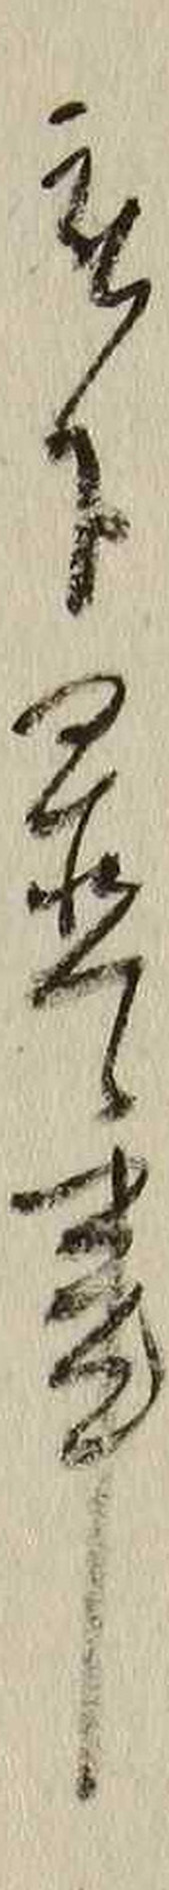被下置候事
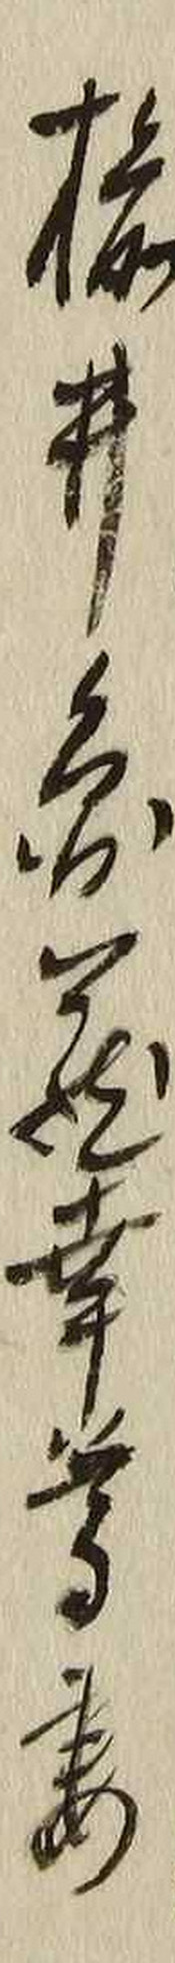楡井円蔵幸尊妻
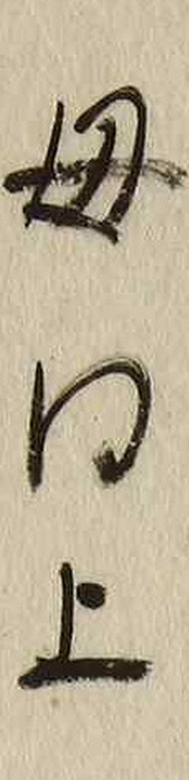母同上
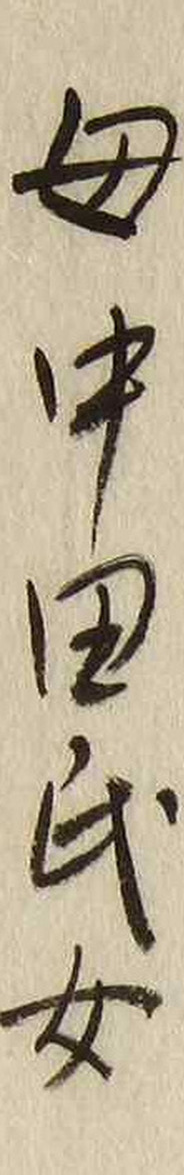母中田氏女

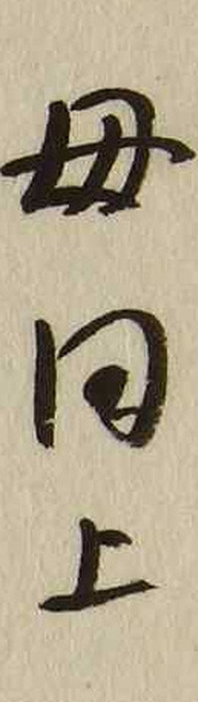母同上
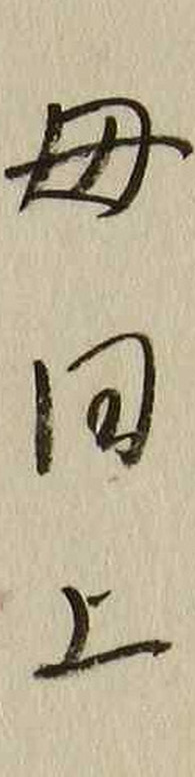母同上
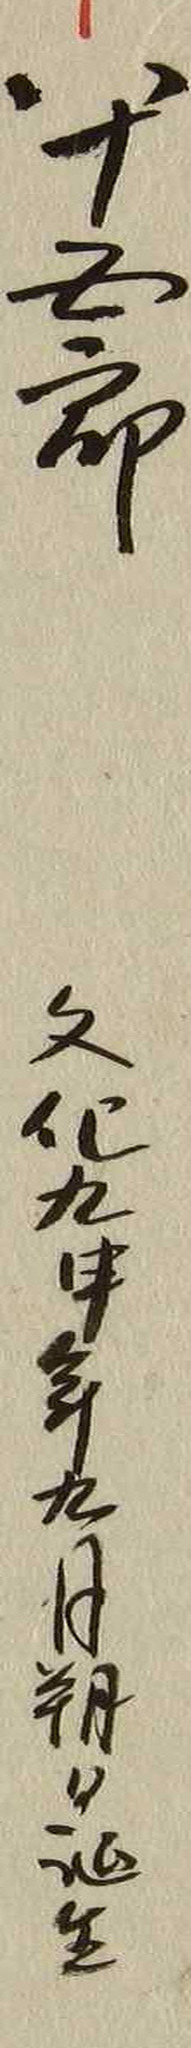八十五郎文化九申年九月朔日誕生
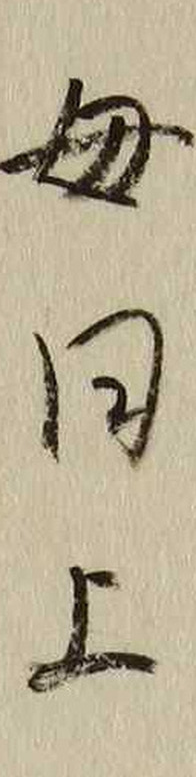母同上
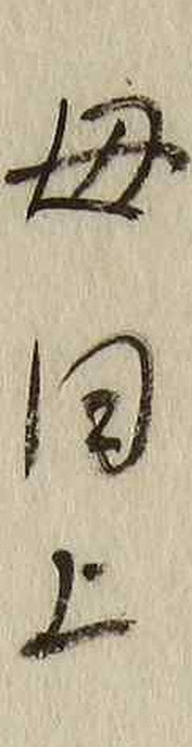母同上
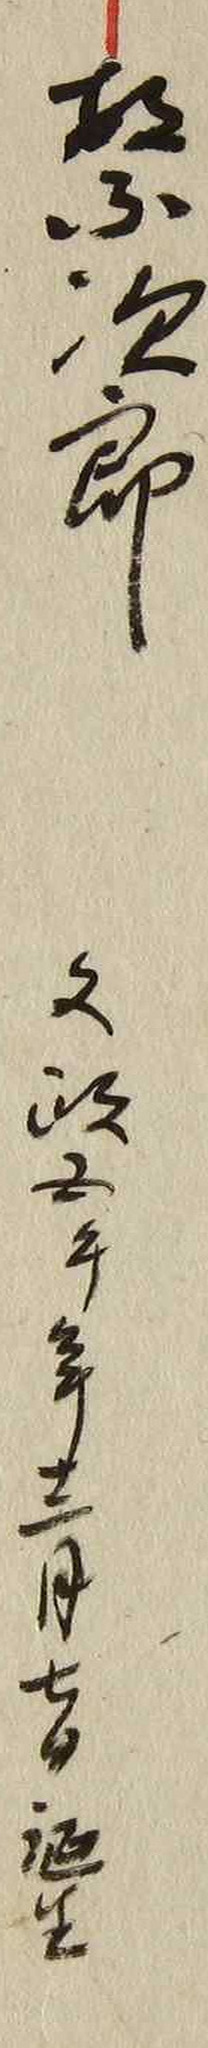繁次郎文政五午年十二月七日誕生
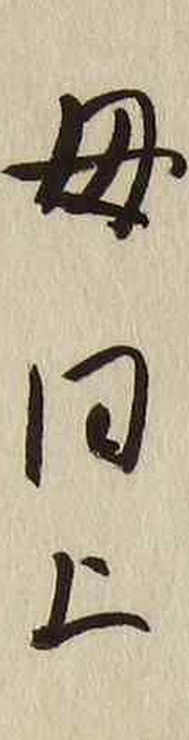母同上
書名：諸士系譜　巻之353　す之部3
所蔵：会津若松市立会津図書館
